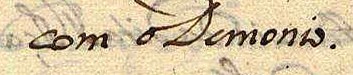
com o Demonio.
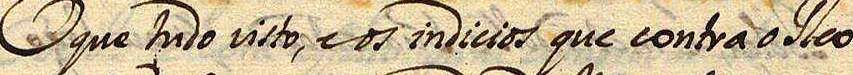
O que tudo visto, e os indicios que contra o Reo
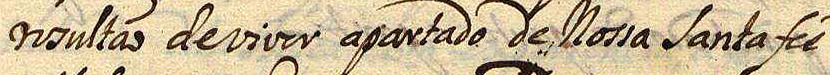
resultaõ de viver apartado de Nossa Santa feé
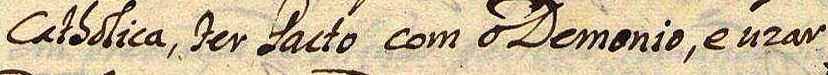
Catholica, ter Pacto com o Demonio, e uzar
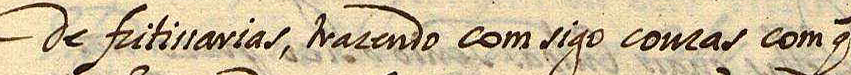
de feitissarias, trazendo comsigo couzas com q̄
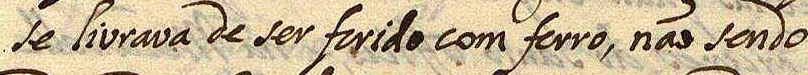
se livrava de ser ferido com ferro, não sendo
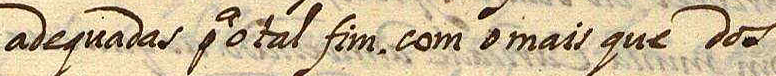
adequadas pa o tal fim, com o mais que dos
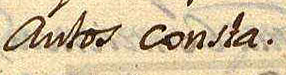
Autos consta.
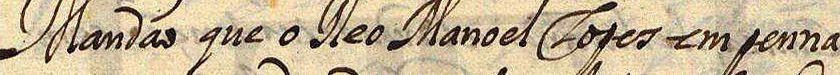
Mandão que o Reo Manoel Lopes em penna,
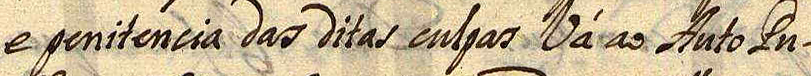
e penitencia das ditas culpas Vá ao Auto Pu
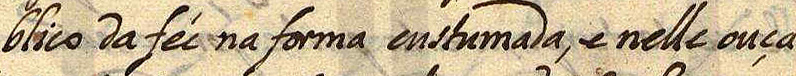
blico da fée na forma custumada, e nelle ouça
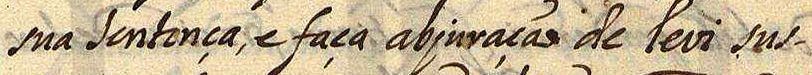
sua Sentença, e faça abjuração de levi, sus
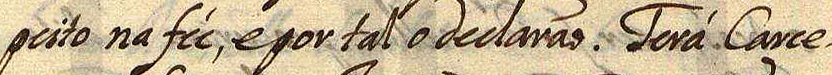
peito na fée, e por tal o declarão. Terá Carce
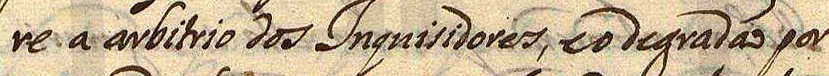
re a arbitrio dos Inquisidores, e o degradaõ por
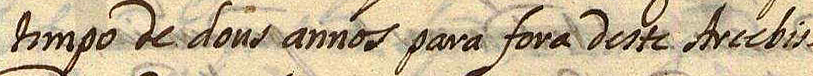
tempo de dous annos para fora deste Arcebis
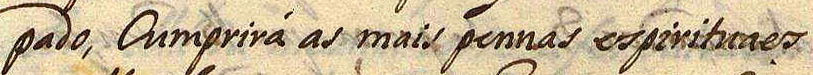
pado, Cumprirá as mais pennas espirituaes
